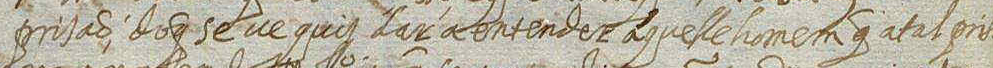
prisaõ, do q̄ se ue quis dar a entender áquelle homem q̄ a tal pris
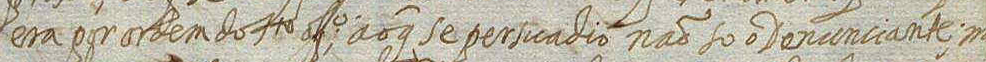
era por ordem do sto off.o ao q̄ se persuadio naõ so o Denunciante, m
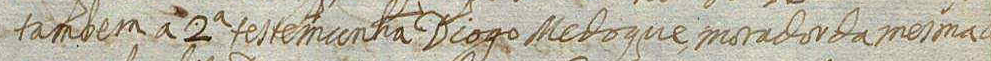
tambem a 2a testemunha Diogo Medoque, morador da mesma
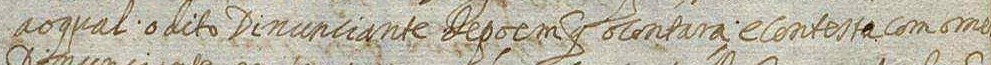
ao qual o dito Denunciante depoem q̄ o contara; e contesta com o me
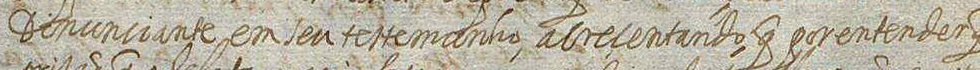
Dinunciante, em seu testemunho, acrecentando, q̄ por entender q̄
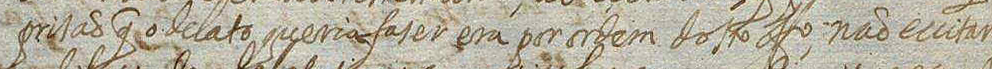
prisaõ q̄ o delato queria fazer era por ordem do sto offo naõ euitar
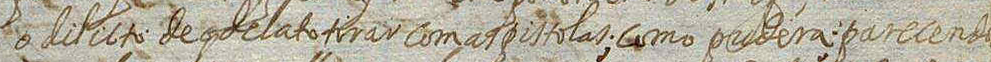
o dilicto de o delato tirar com as pistolas; como pudera; parecendo
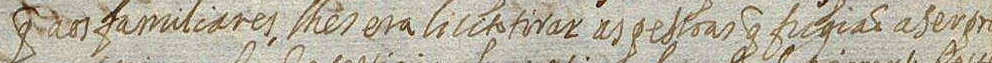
q̄ aos familiares, lhes era licito tirar ás pessoas q̄ fugiaõ a ser pre
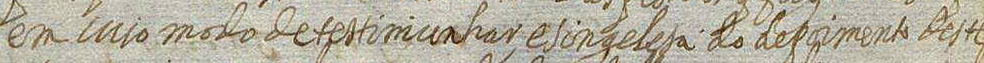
em cuio modo de testimunhar, e singelesa do depoimento deste
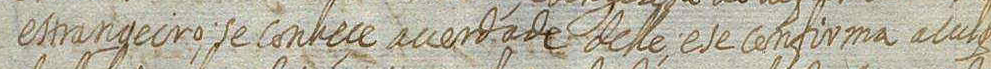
estrangeiro, se conhece a uerdade delle, e se confirma a culp
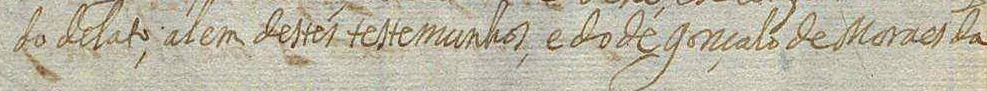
do delato, alem destes testemunhos, e do de Gonçalo de Moraes da
